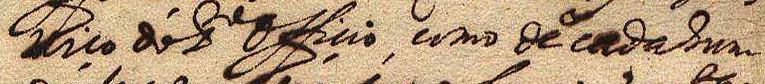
uiço do sto Officio, como de cada hum
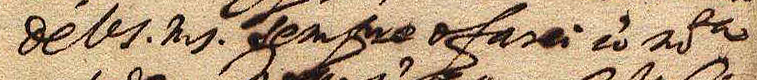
de Vs. ms. sempre o farei cō mta
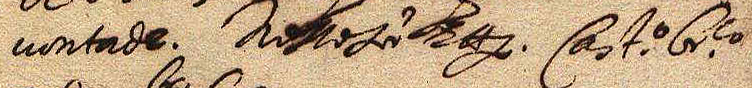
uontade. Nosso sor̄ Ettꝭ. Cast.o br.co
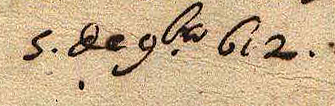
5. de 9.bro 612.
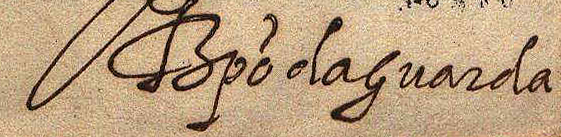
O Bpō da Guarda.
